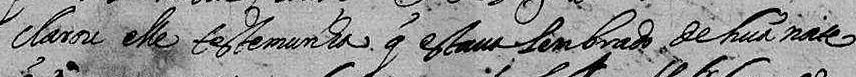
clarou elle testemunha q̄ estaua lembrado de huā noite
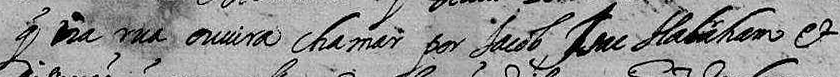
q̄ na rua ouuira chamar por Iacob, Jesse Habraham &
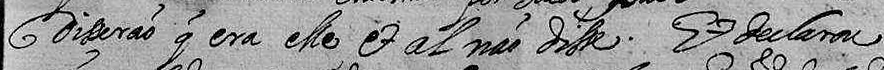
disseraõ q̄ era elle & al naõ disse. & declarou
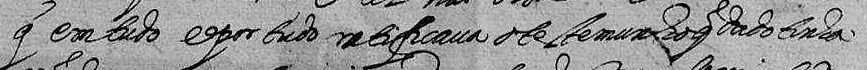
q̄ em tudo & por tudo ratificaua o testemunho q̄ dado tinha
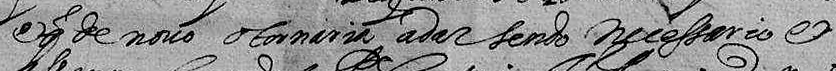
& q̄ de nouo o tornaria a dar sendo necessario &
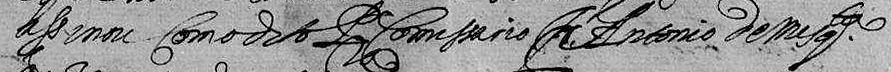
assinou Com o ditto Pe Comissario fr. Antonio de mesq.ta
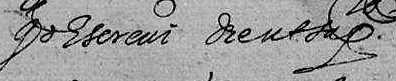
q̄ o Escreui die ut sup.ra
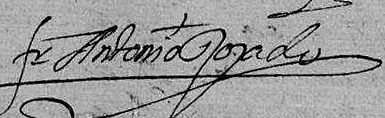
fr Antonio Rozado
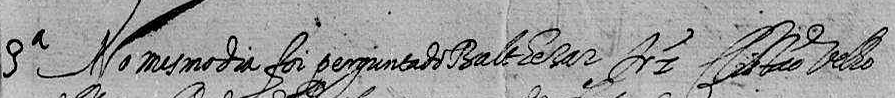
3a No mesmo dia foi perguntado Balthezar frz̄ Christaõ velho
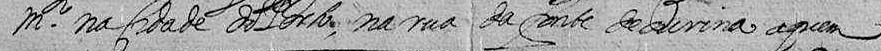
mor. na Cidade do Porto, na rua da fonte de ourina a quem
